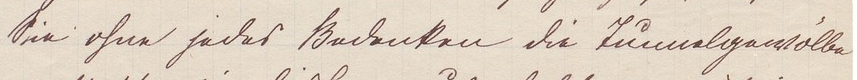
Sie ohne jedes Bedenken die Tunnelgewölbe
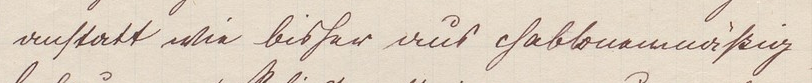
anstatt wie bisher aus chablonenmäßig
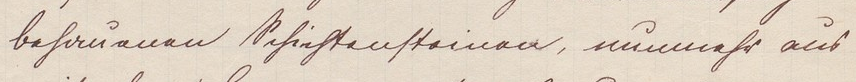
behauenen Schichtensteinen, nunmehr aus
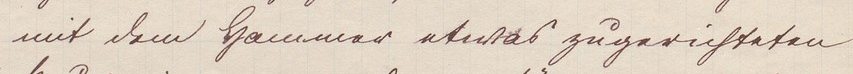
mit dem Hammer etwas zugerichteten
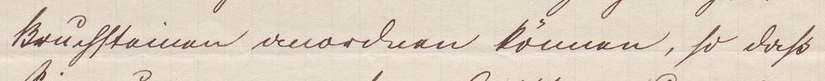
Bruchsteinen anordnen können, so daß
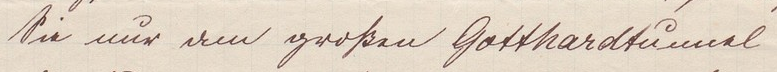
Sie nur am großen Gotthard tunnel
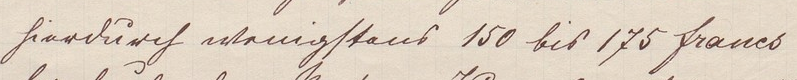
hierdurch wenigstens 150 bis 175 Francs
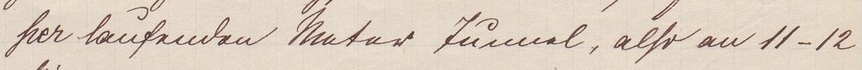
per laufenden Meter Tunnel, also an 11-12
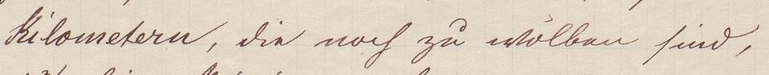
Kilometern, die noch zu wölben sind,
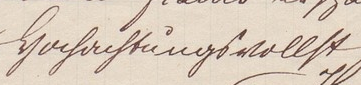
Hochachtungsvollst
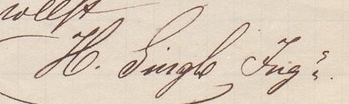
H. Single Ingr
